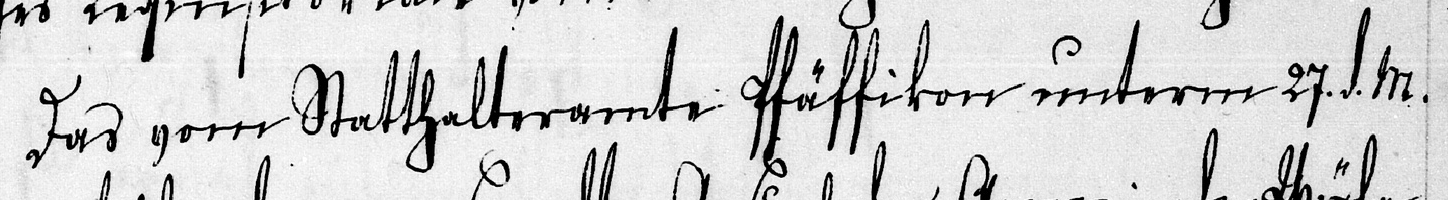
Das vom Statthalteramte Pfäffikon unterm 27. d. M.
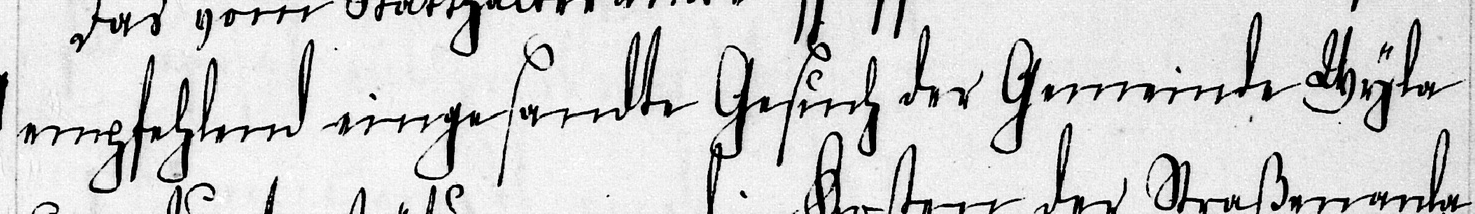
empfehlend eingesandte Gesuch der Gemeinde Wyla
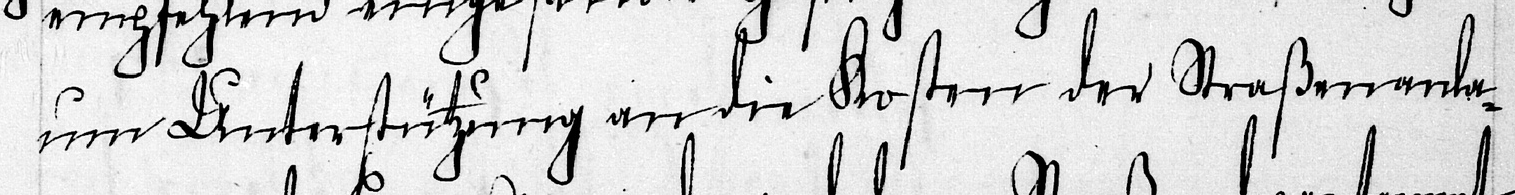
um Unterstützung an die Kosten der Straßenanla¬
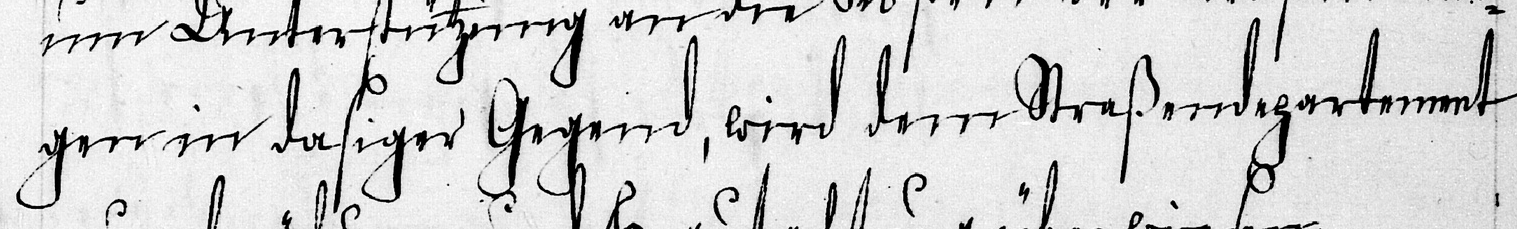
gen in dasiger Gegend, wird dem Straßendepartement
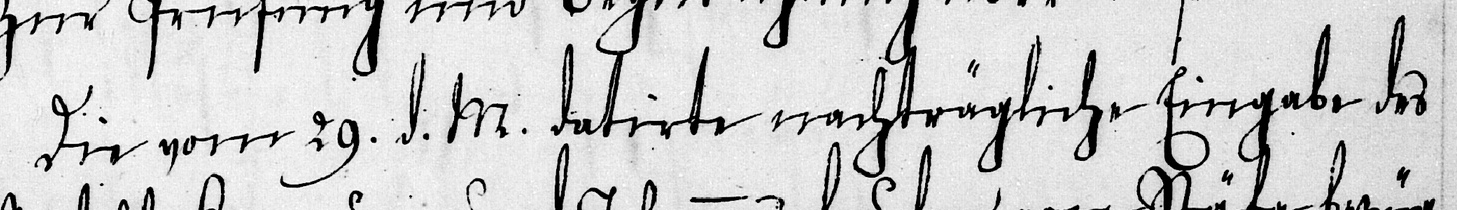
Die vom 29. d. M. datirte nachträgliche Eingabe des
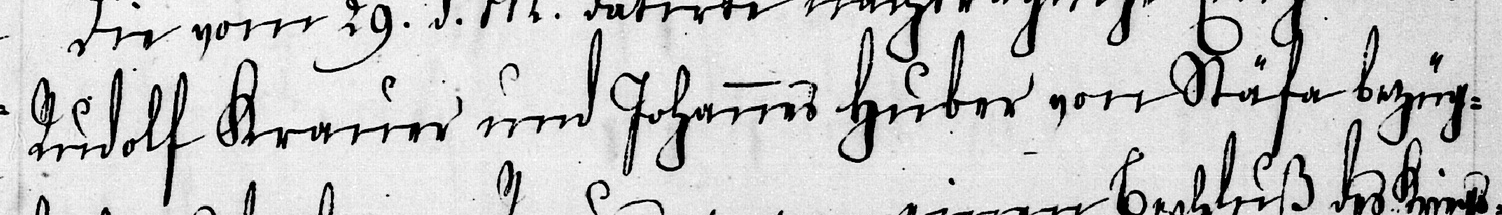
Rudolf Krauer und Johannes Huber von Stäfa bezüg¬
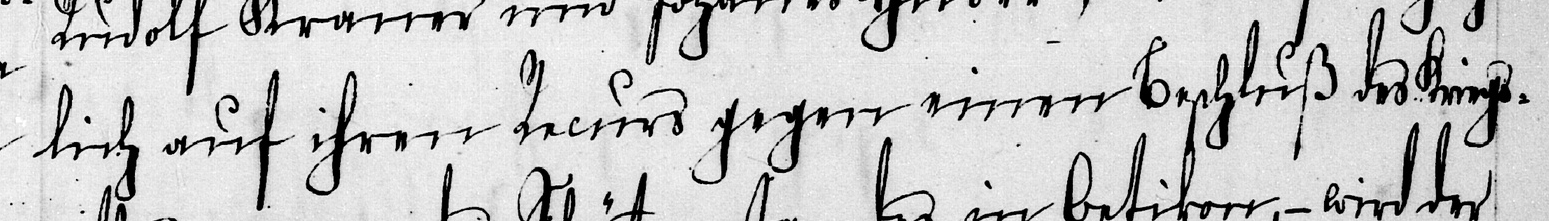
lich auf ihren Recurs gegen einen Beschluß des Kriegs¬
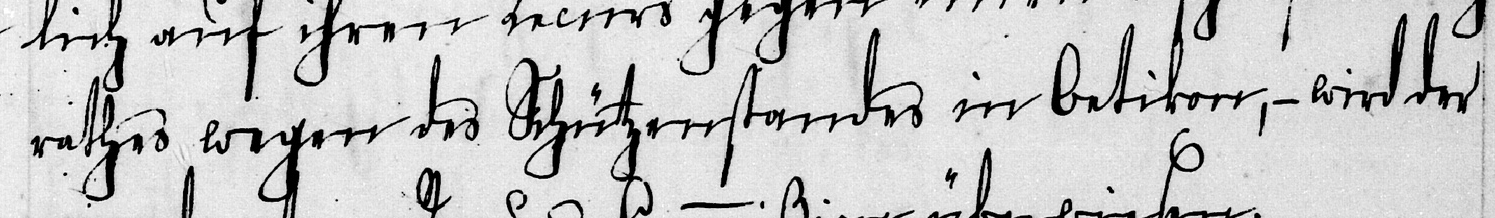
rathes wegen des Schützenstandes in Oetikon, – wird der
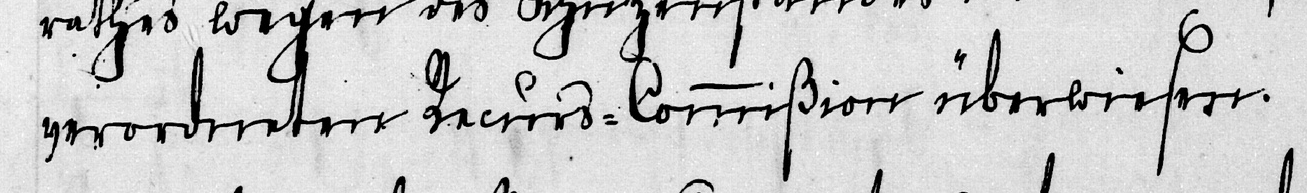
verordneten Recurs-Commißion überwiesen.
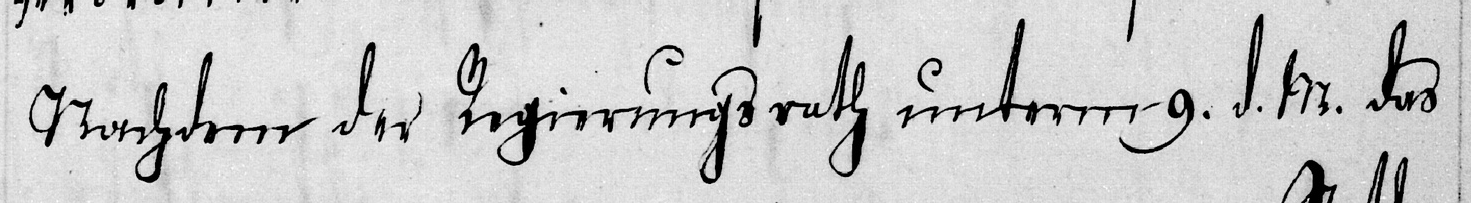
Nachdem der Regierungsrath unterm 9. d. M. das
